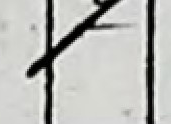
7
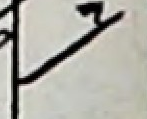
7
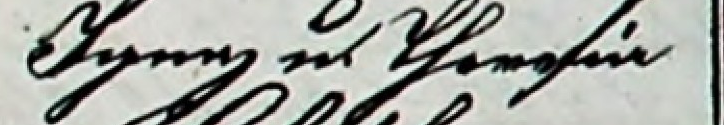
Ignaz u. Theresia
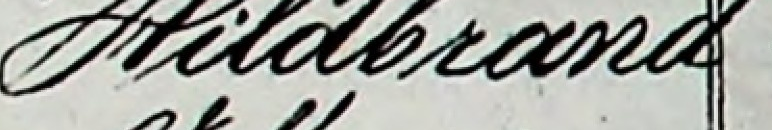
Hildbrand
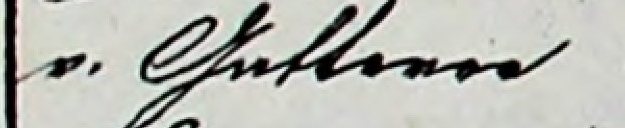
v. Gatterer
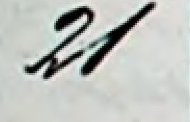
21
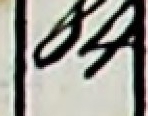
84
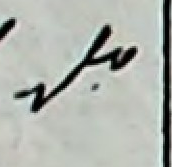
do
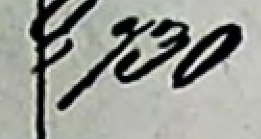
0,730
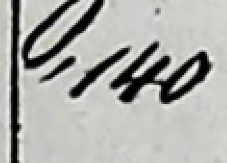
0,140
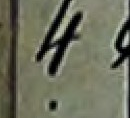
4
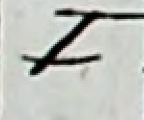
I
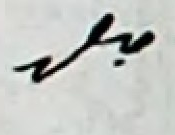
do
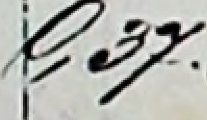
0,37
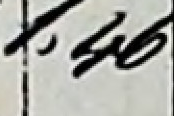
1,46
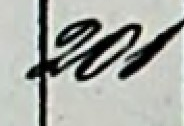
201
